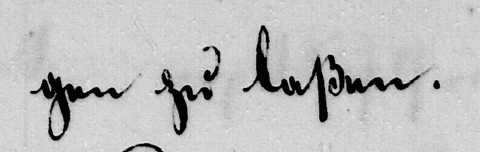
gen zu laßen.
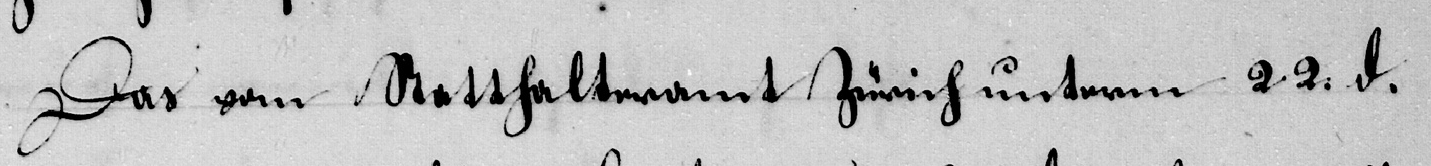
Das vom Statthalteramt Zürich unterm 22. d.
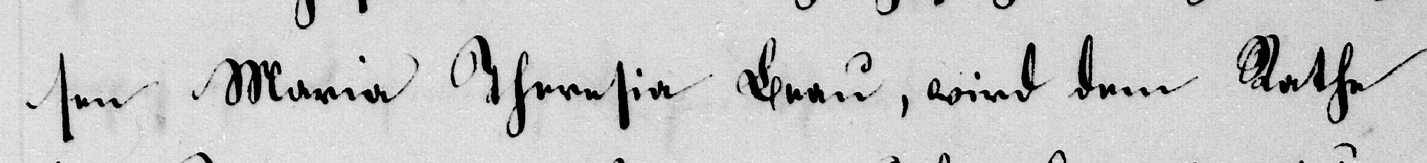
sen Maria Theresia Brau, wird dem Rathe
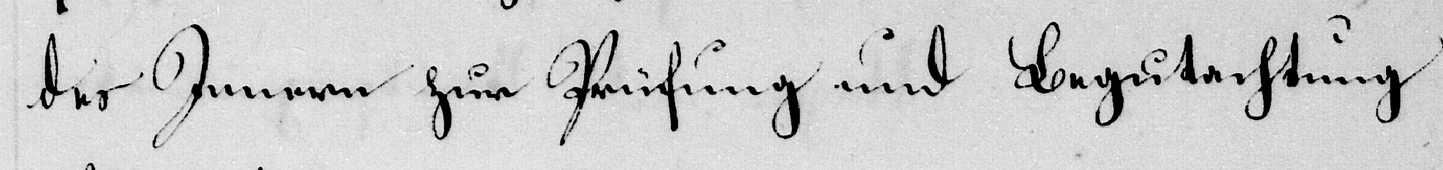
des Innern zur Prüfung und Begutachtung
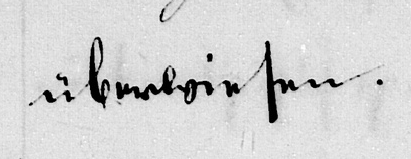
überwiesen.
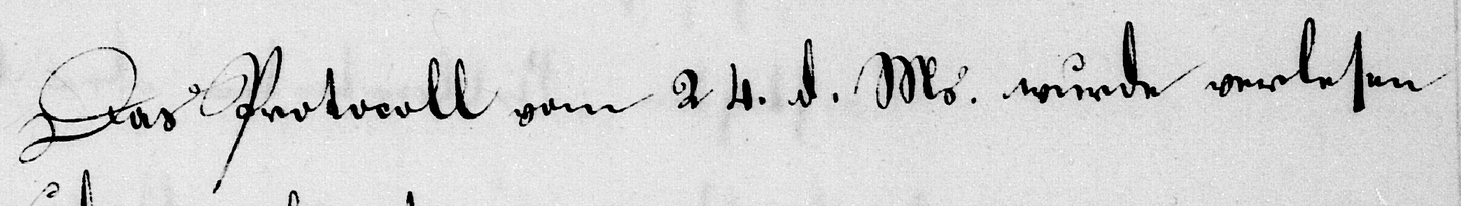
Das Protocoll vom 24. d. Ms. wurde verlesen
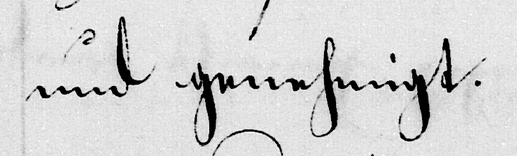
und genehmigt.
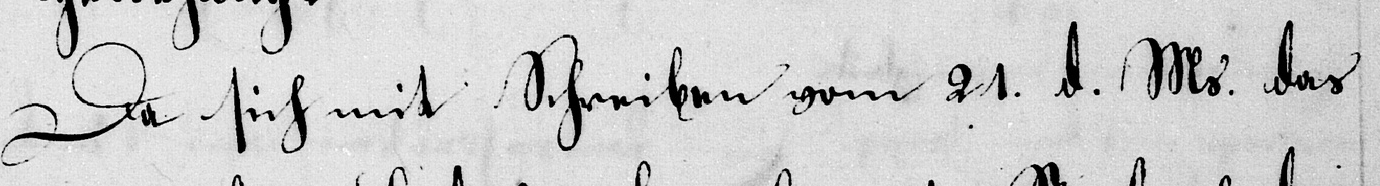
Da sich mit Schreiben vom 21. d. Ms. das
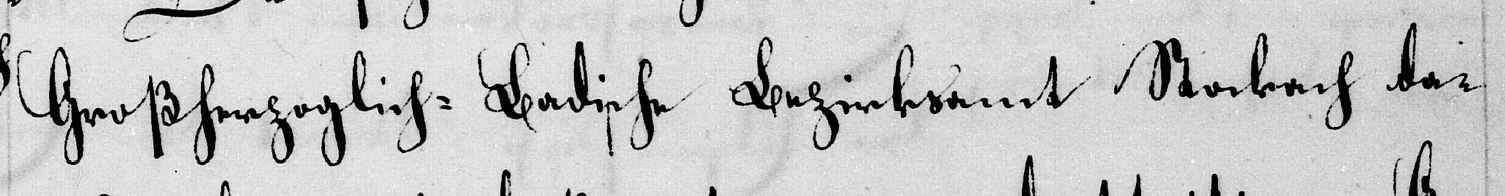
Großherzoglich-Badische Bezirksamt Stockach da¬
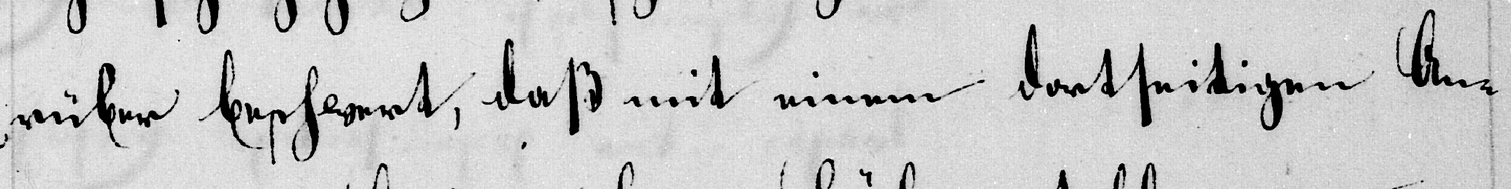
rüber beschwert, daß mit einem dortseitigen An¬
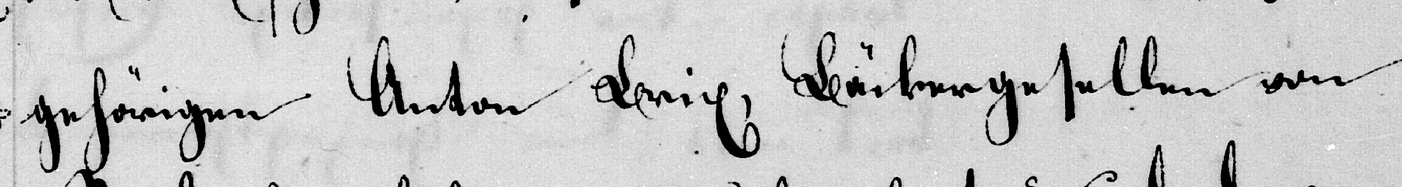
gehörigen Anton Brix, Bäckergesellen von
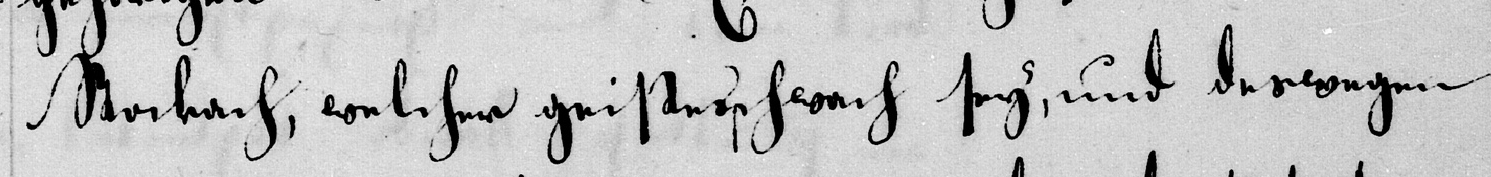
Stockach, welcher geistesschwach sey, und deswegen
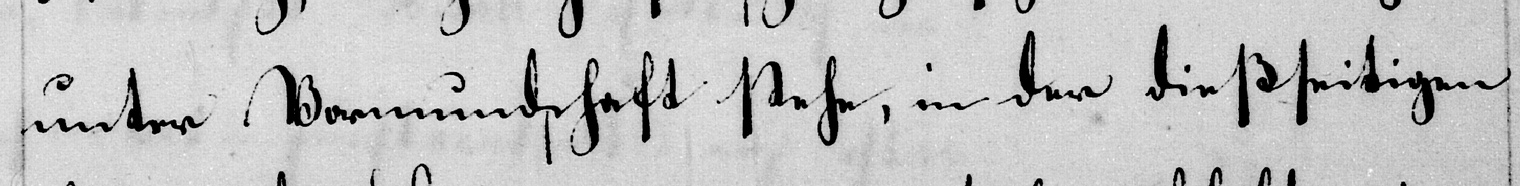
unter Vormundschaft stehe, in der dießseitigen
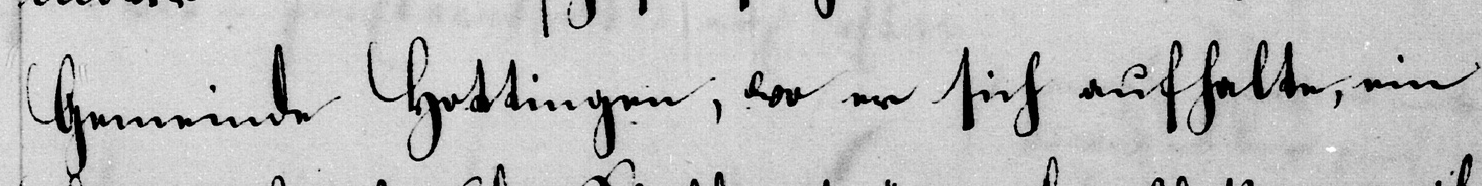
Gemeinde Hottingen, wo er sich aufhalte, ein
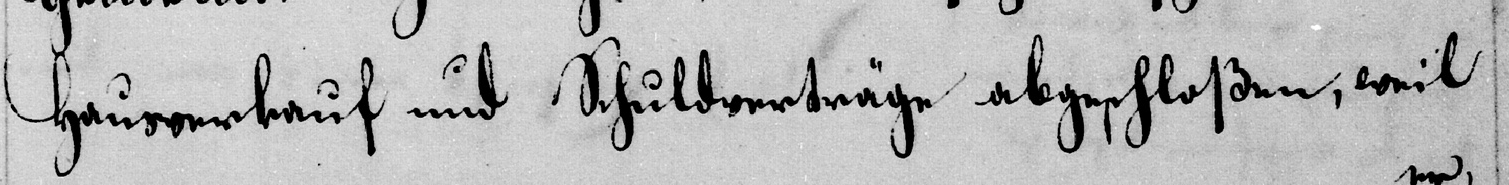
Hausverkauf und Schuldverträge abgeschloßen, weil
